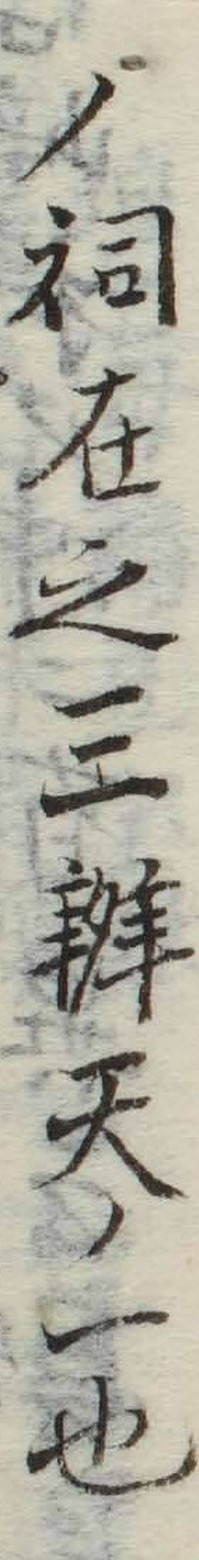ノ祠在之三弁天ノ一也

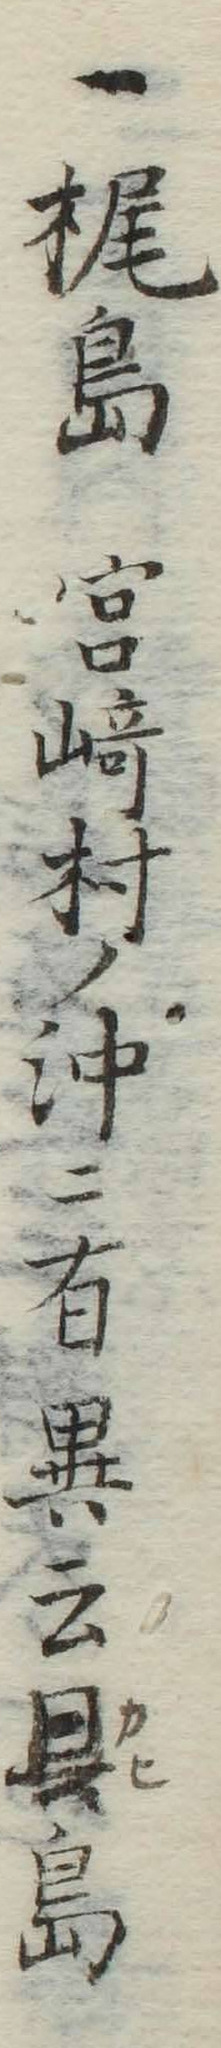一梶島宮崎村ノ沖ニ有異云貝島
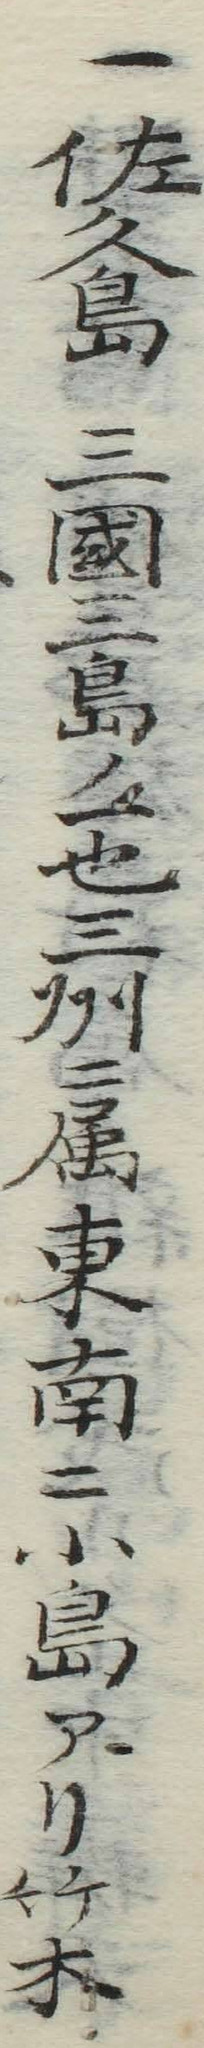一作久島三国三島ノ一也三州ニ属東南ニ小島アリ竹木
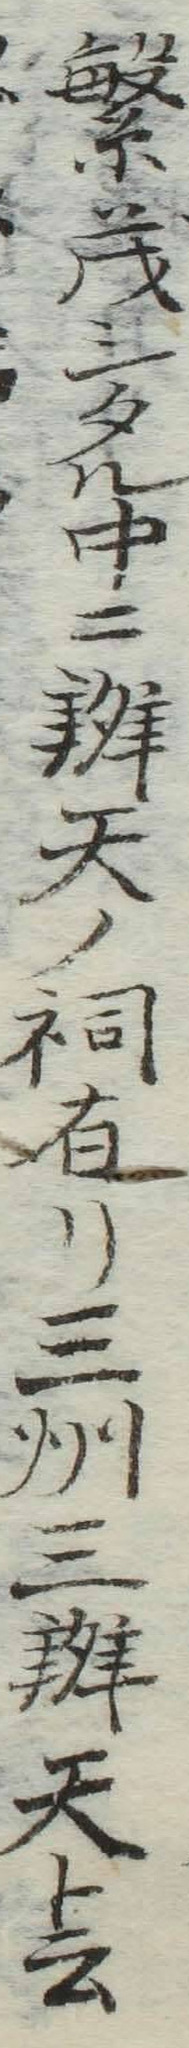繁茂シタル中ニ弁天ノ祠有リ三州三弁天ト云
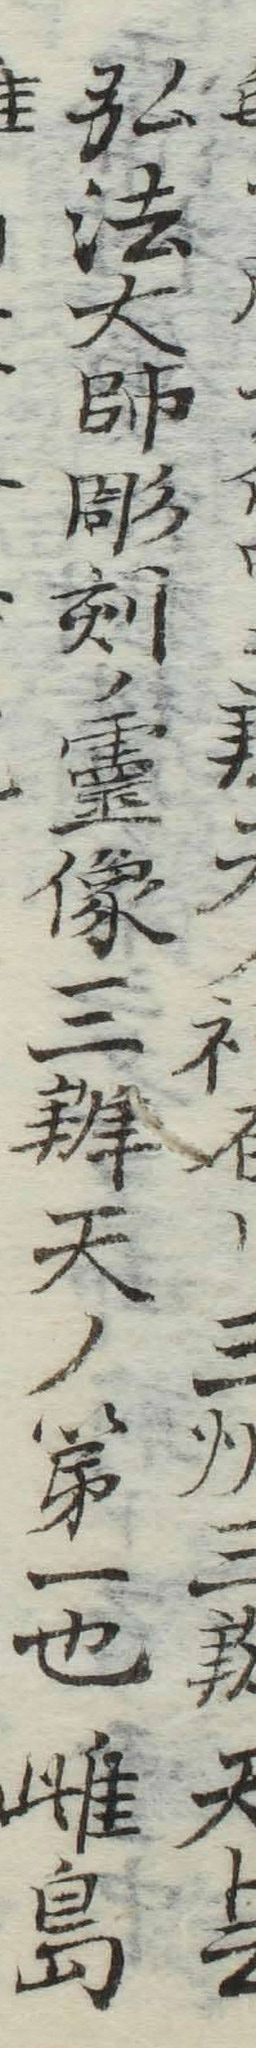弘法大師彫刻ノ霊像三弁天ノ第一也雌島
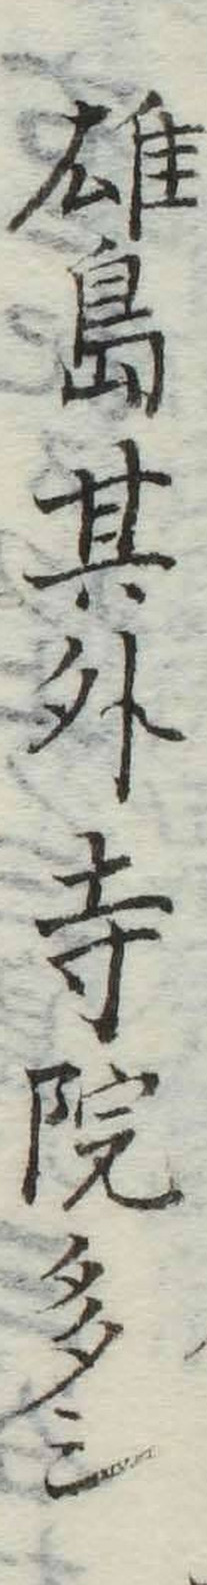雄島其外寺院多シ
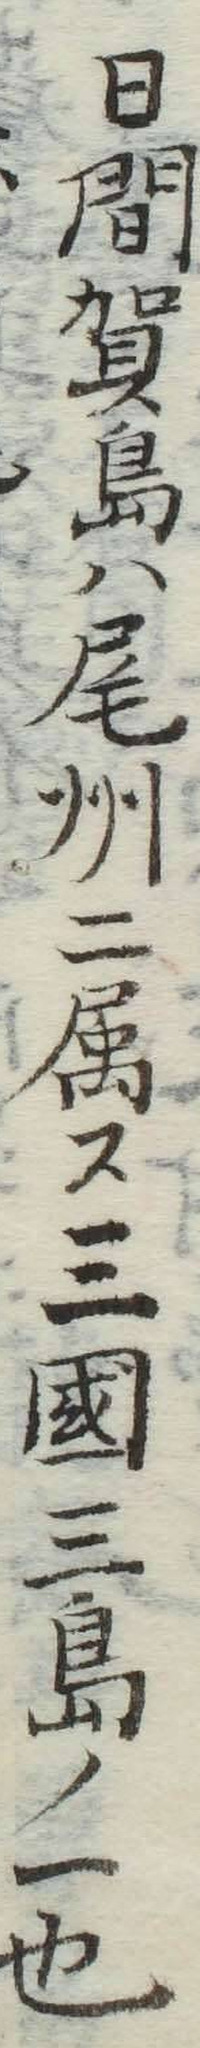日間賀島ハ尾州ニ属ス三国三島ノ一也
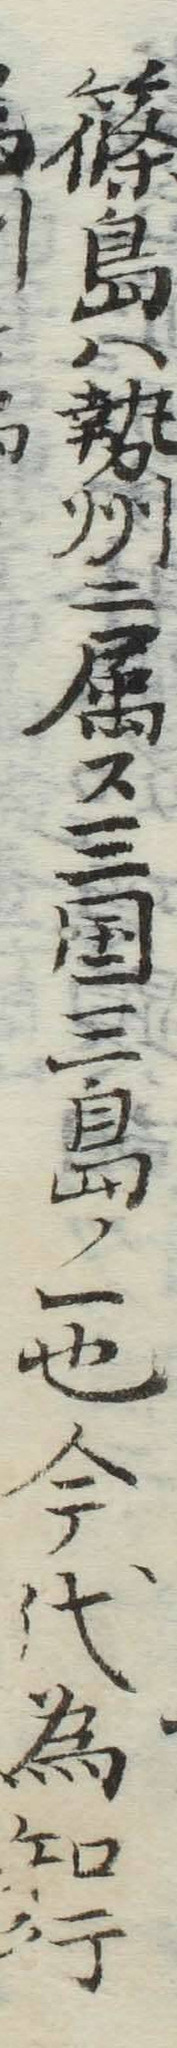篠島ハ勢州ニ属ス三国三島ノ一也今代為知行
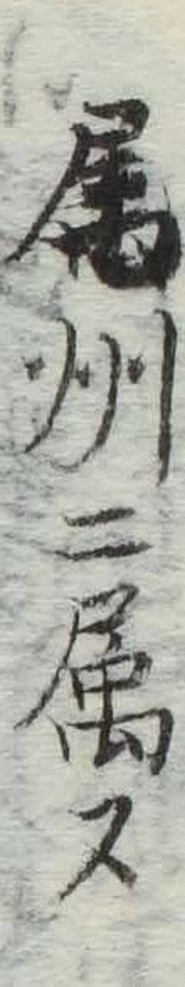属州ニ属ス
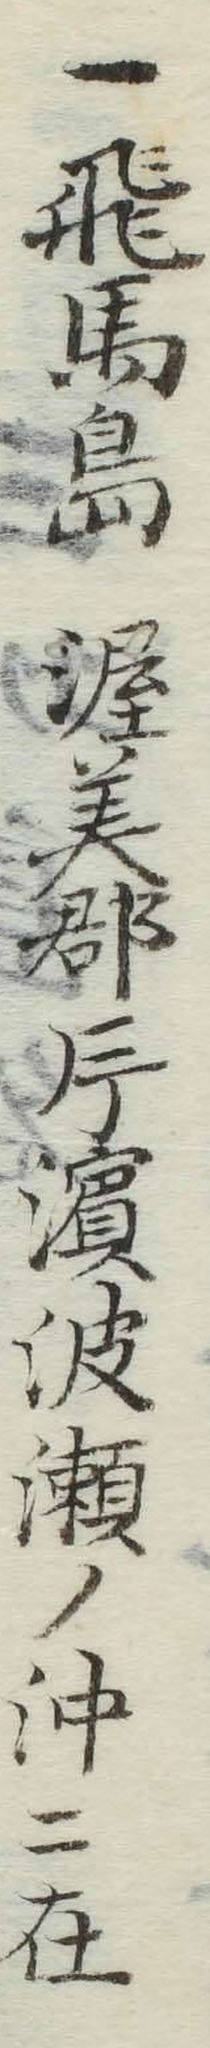一飛馬島渥美郡片浜波瀬ノ沖ニ在
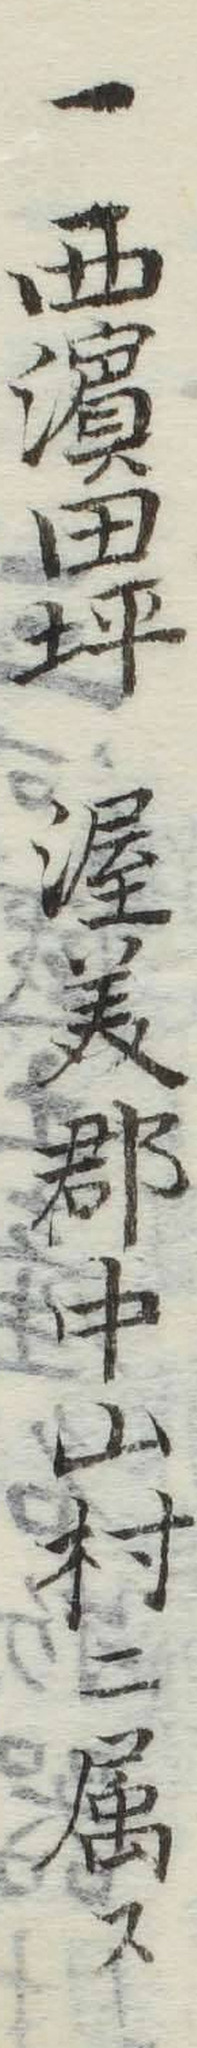一西浜田坪渥美郡中山村ニ属ス
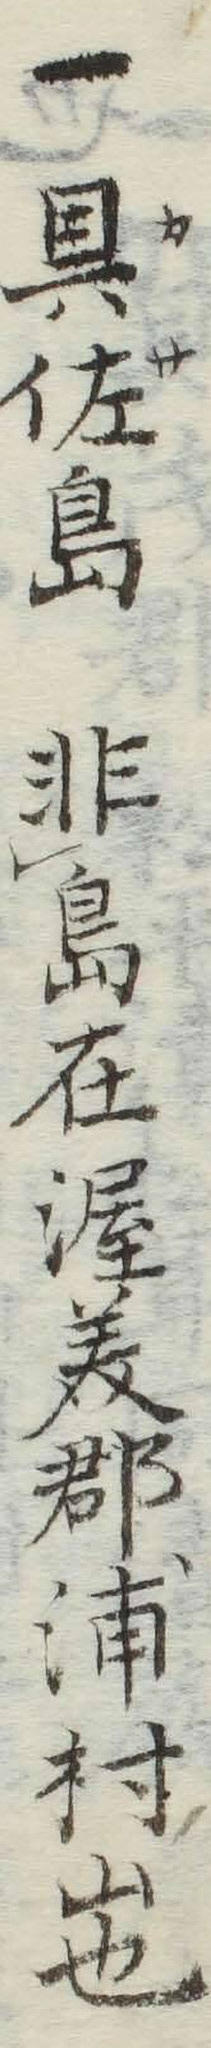一具佐島非島在渥美郡浦村山也
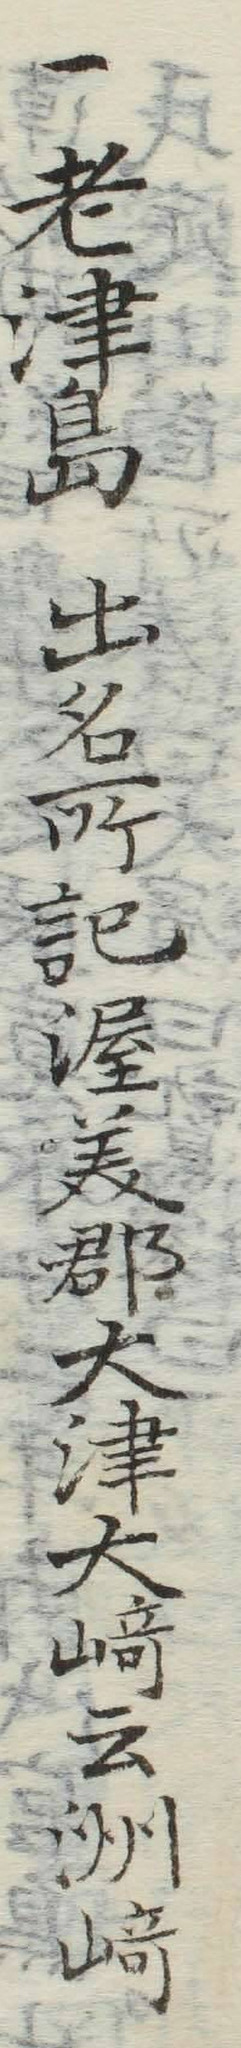一老津島出名所記渥美郡大津大崎云洲崎
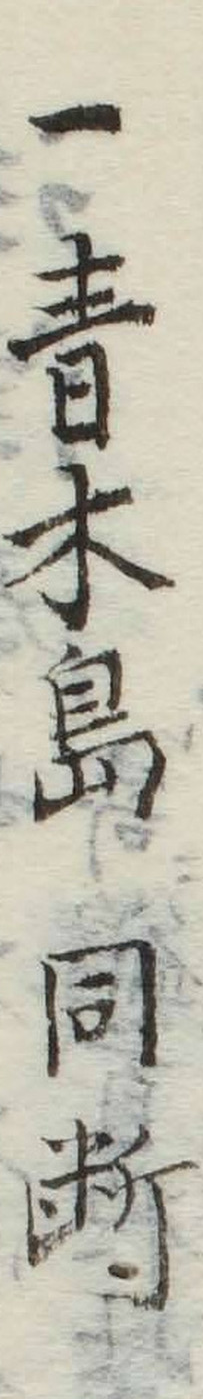一青木島同断
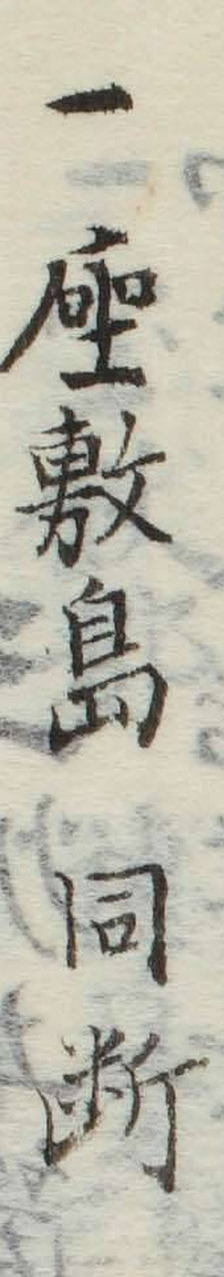一座敷島同断

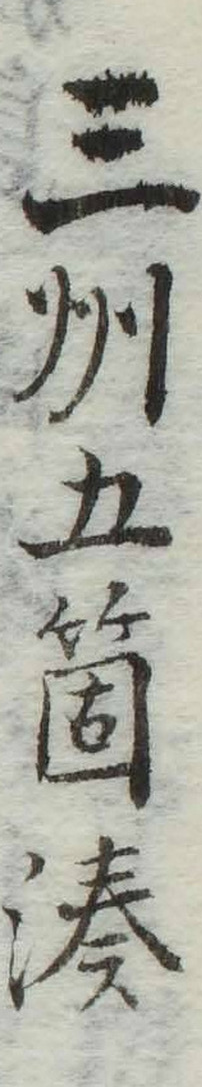三州五箇湊
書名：三河国二葉松
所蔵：国文学研究資料館
